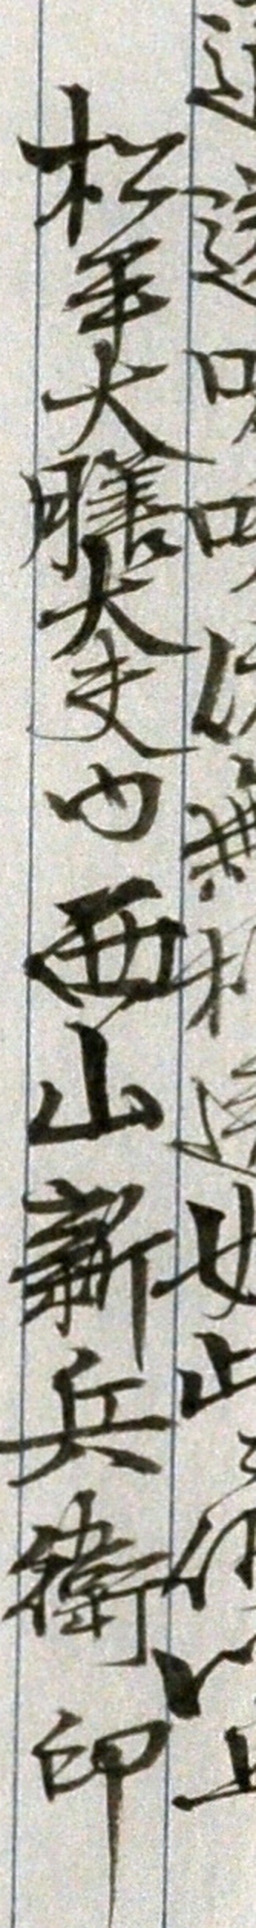月日松平大膳大夫内西山新兵衛印
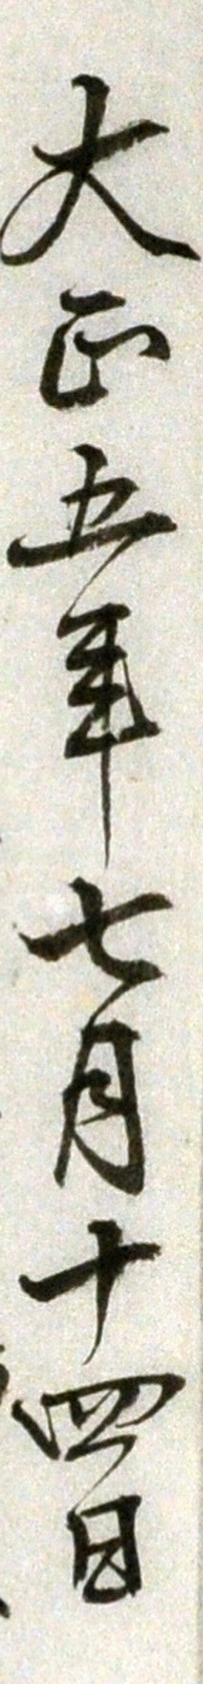大正五年七月十四日
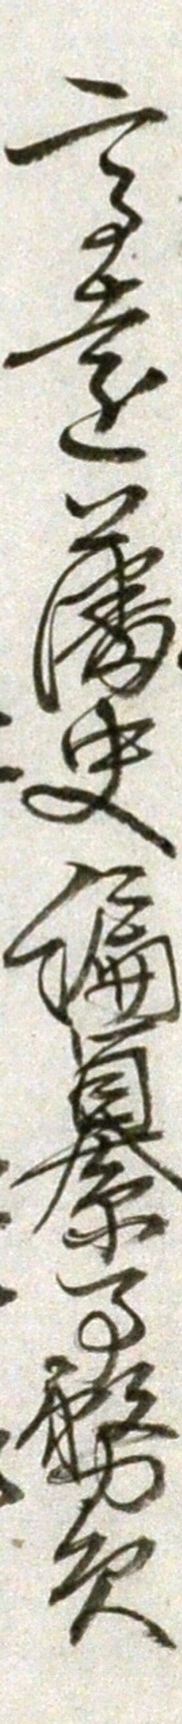高遠藩史編纂事務員
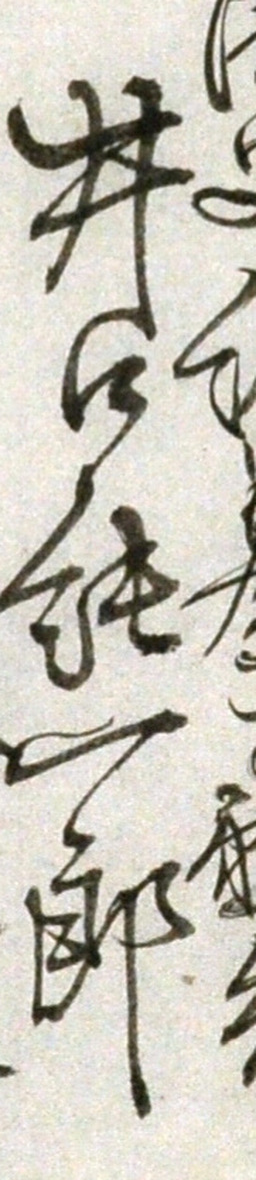井口純一郎
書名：御廻米難船始末
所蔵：伊那市立高遠町図書館・合同会社AMANE
